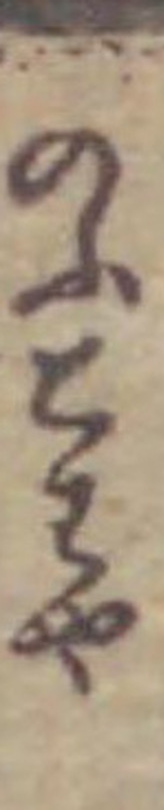のふこはや
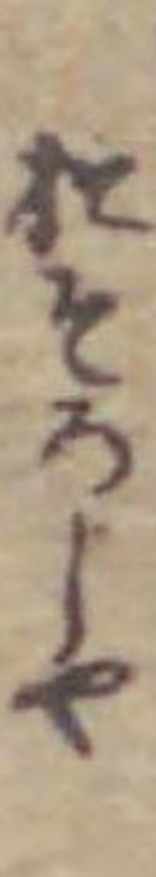おそろしや

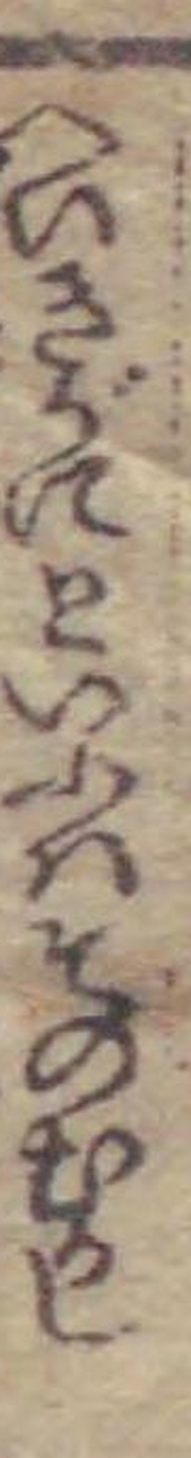へいきがにといふはそのむかし
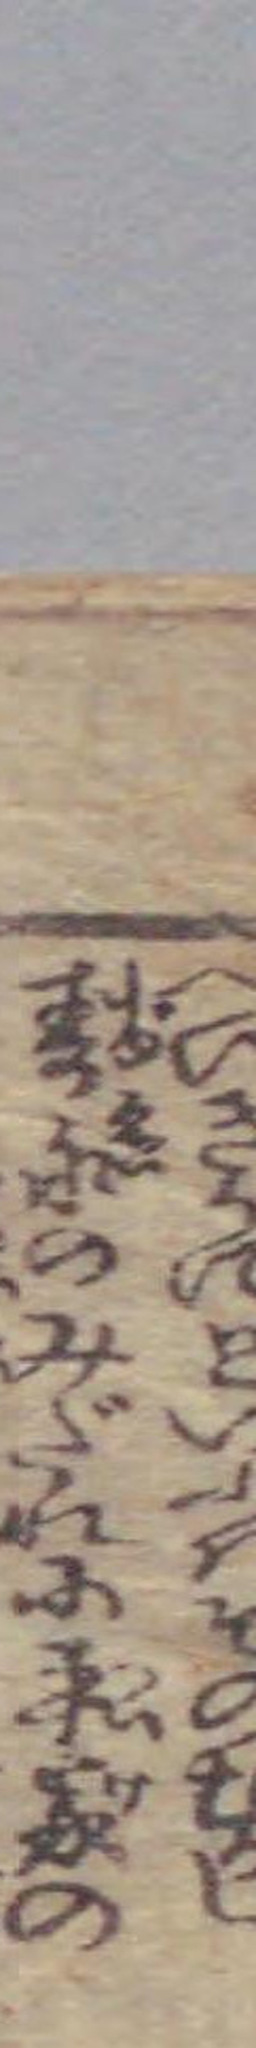寿永のみだれに平家の
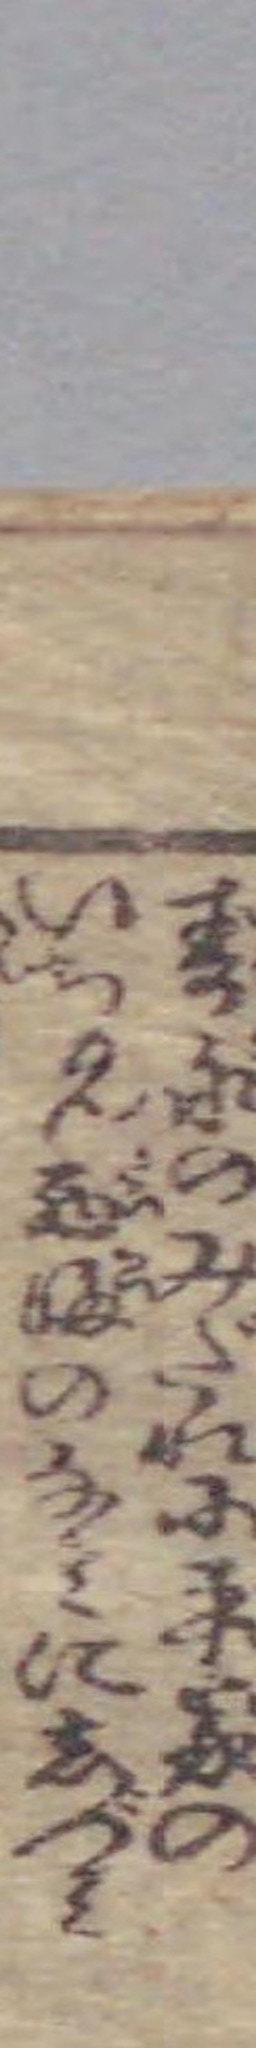いちもん西海のなみにしづみ
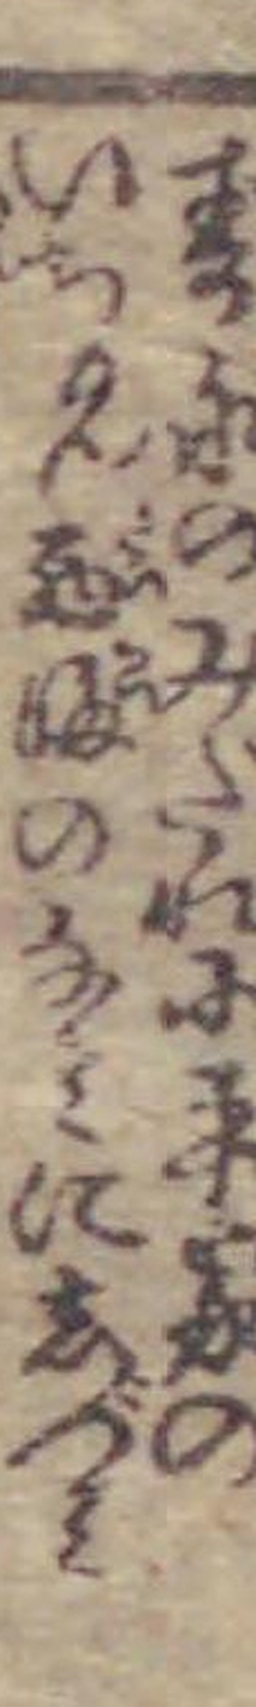いちもん西海のなみにしづみ
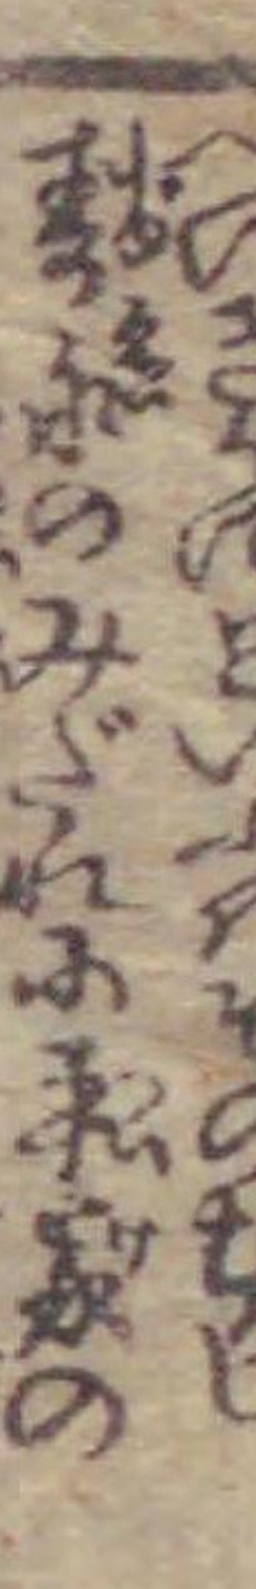寿永のみだれに平家の
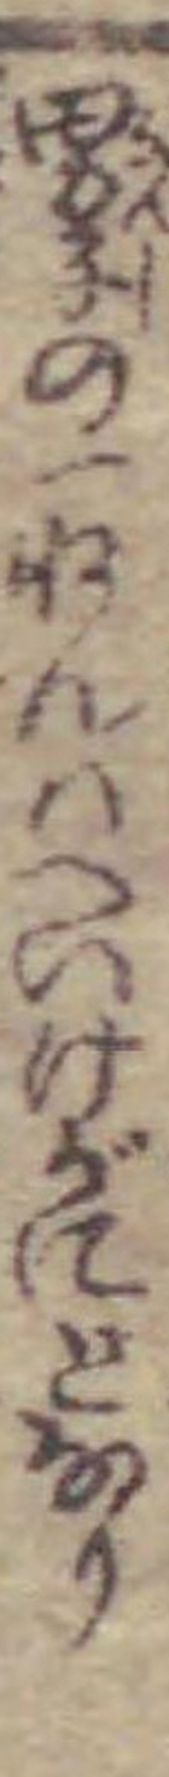男子の一ねんはへいけがにとなり
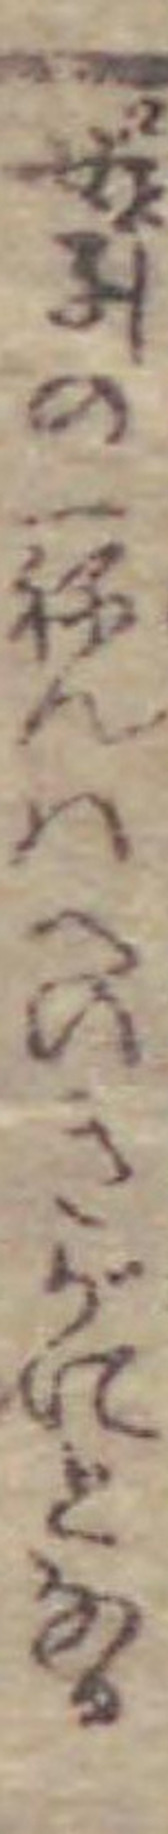女子の一ねんはへいきがにとなる
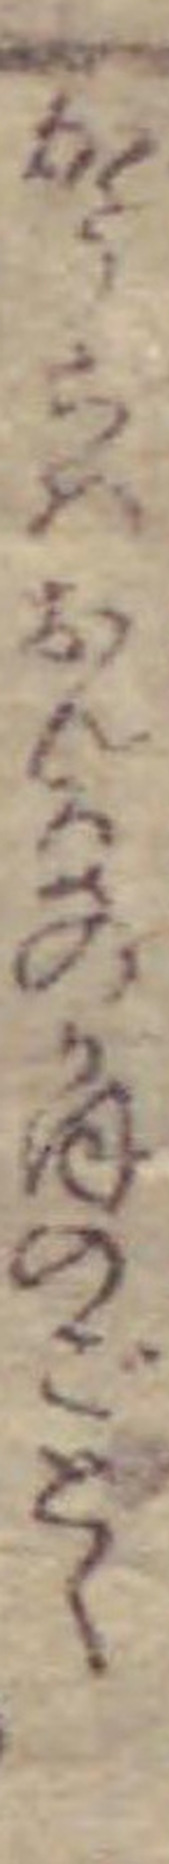かうらはおんなのかほのごとく
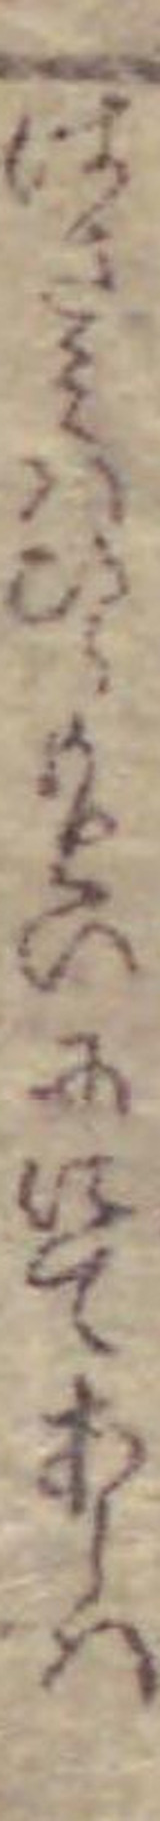はさみはひらもといににてあしは
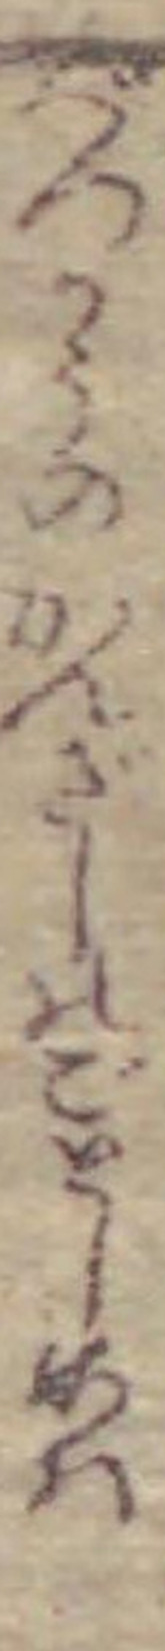べつかうのかんざしのごとしめは
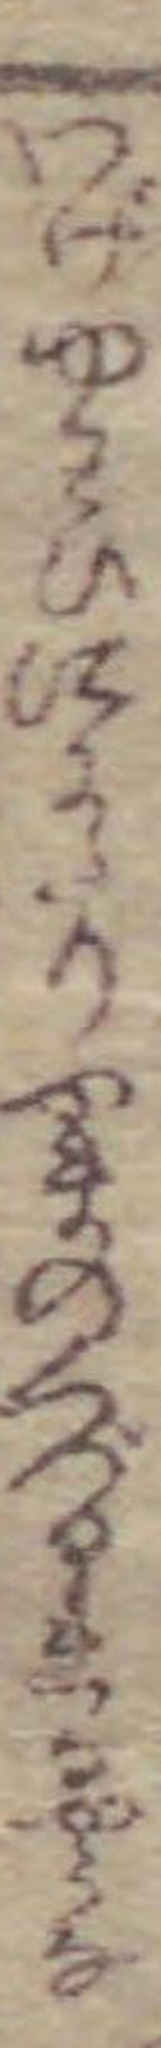わげゆわひににたりやまのくづるゝやうな
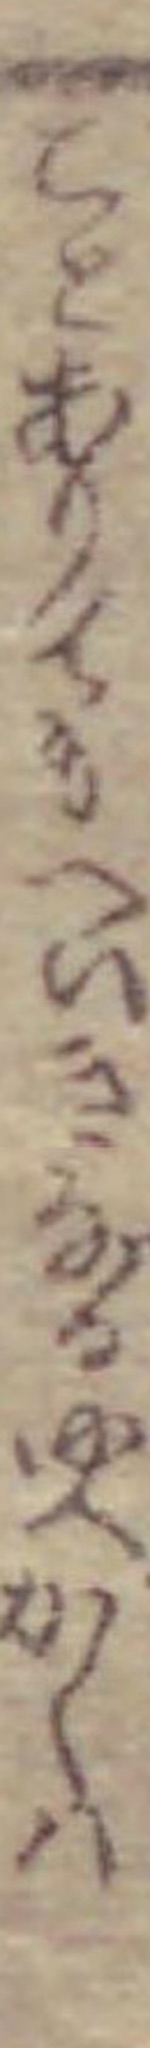ことありてもへいきなるゆへかくは
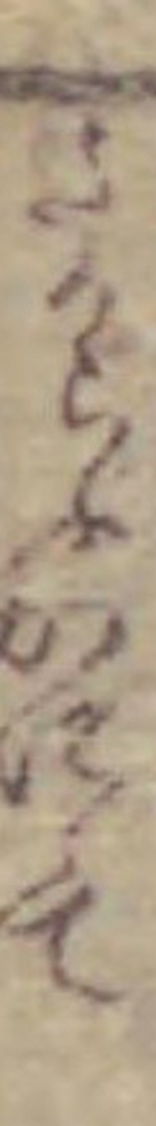さからふかにゝて
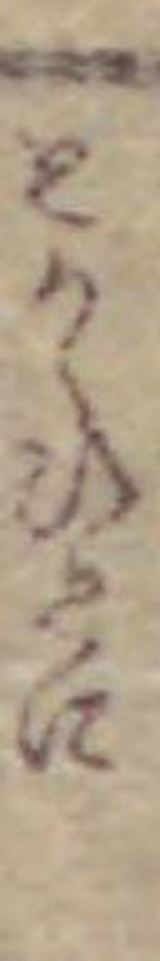とかくひとに
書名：化物和本草 : 3巻
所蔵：国立国会図書館 National Diet Library, JAPAN
